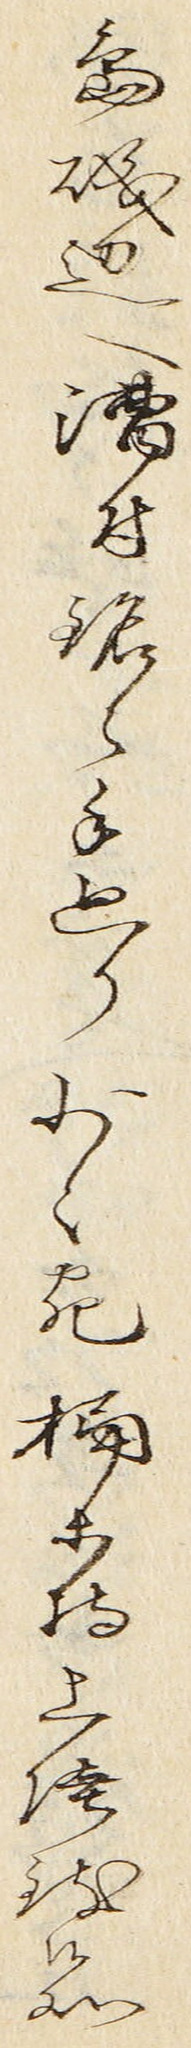島礒辺へ漕付銘々手廻り少し宛桶等持上陸致候処
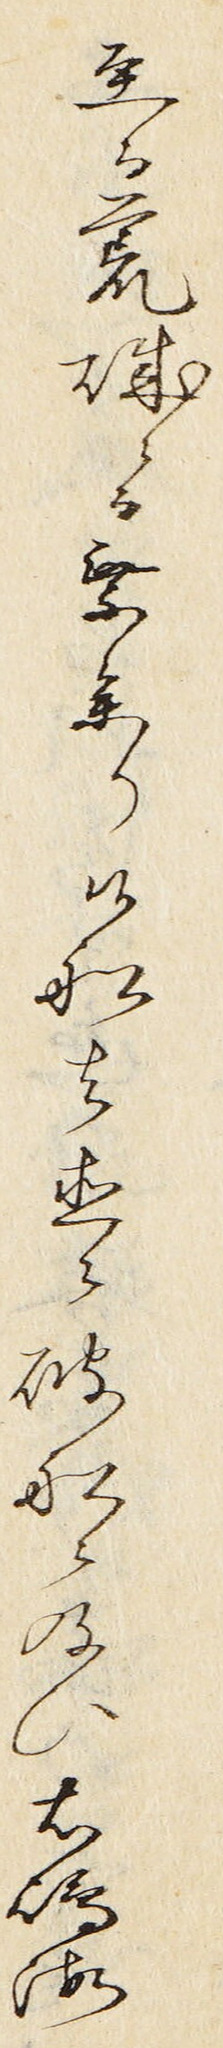至而荒磯に而乗参り候船は直に破船に及ひ右嶋海
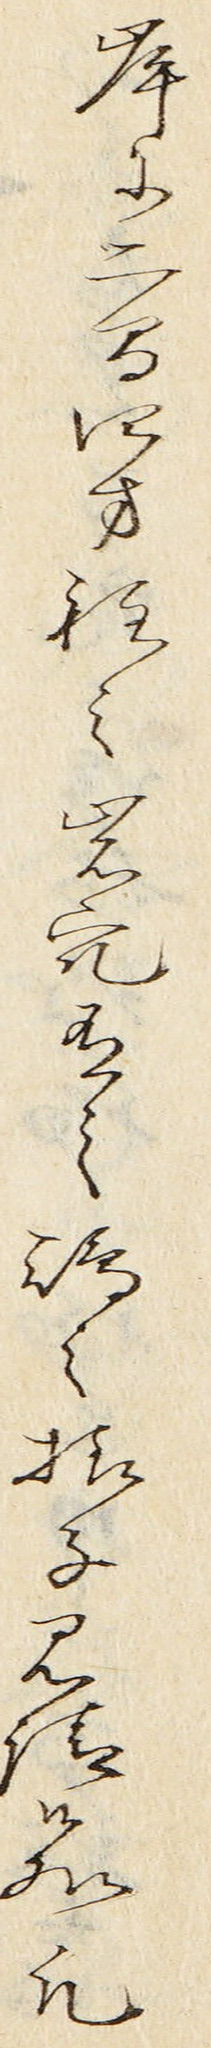岸に二間四方程之岩穴有之嶋之様子見請候処凡
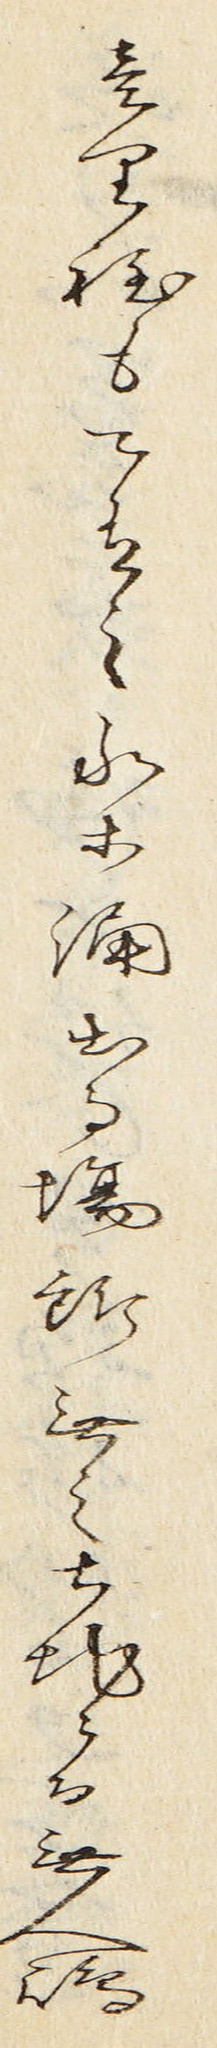壱里程も可有之水等涌出る場所無之土地に而無人嶋
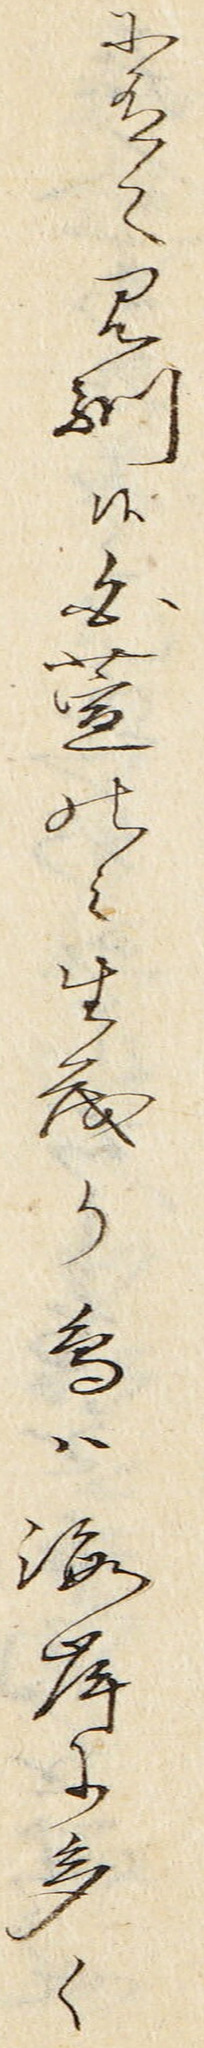に有之見馴候白萱のみ生茂り島は海岸に多く
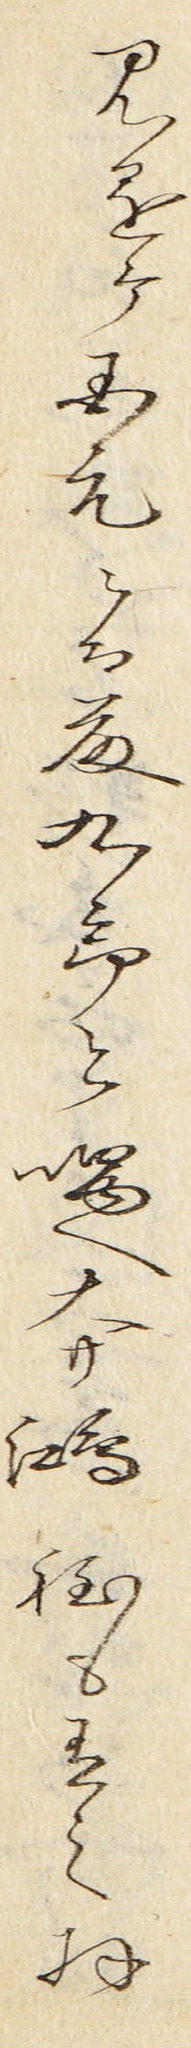見懸け国元に而藤九郎と唱へ大さ鴻程も有之羽

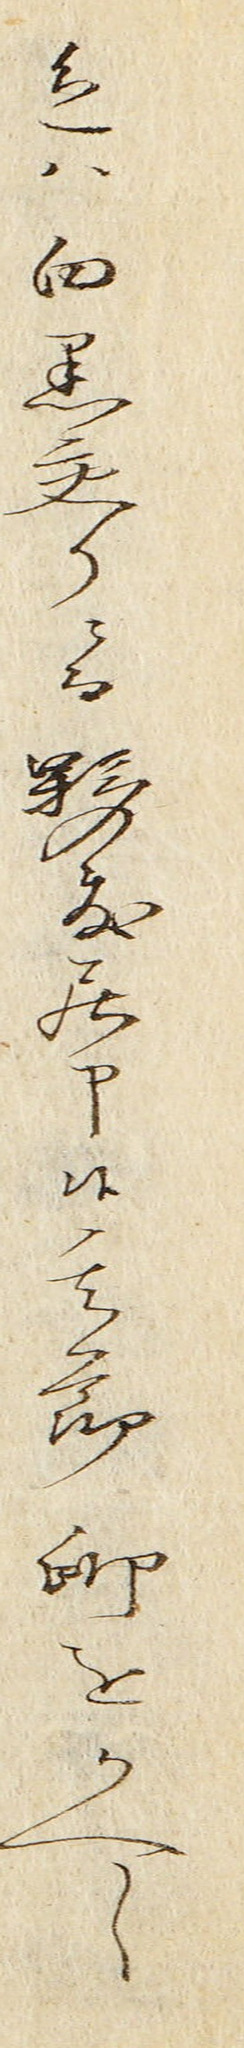色は白黒交りに而夥敷居申候其節卵をかへし
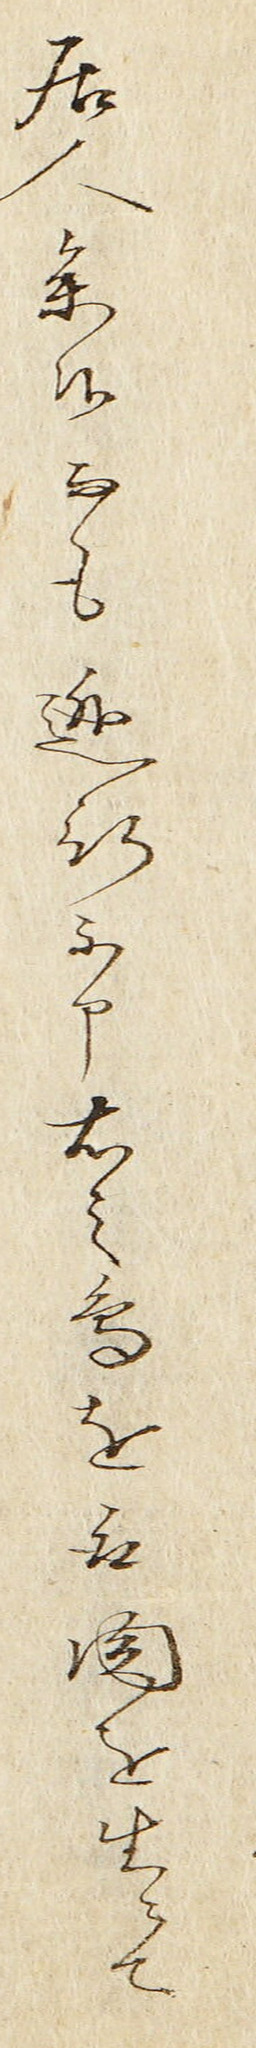居人参候而も逃行不申右之鳥を取肉を生にて
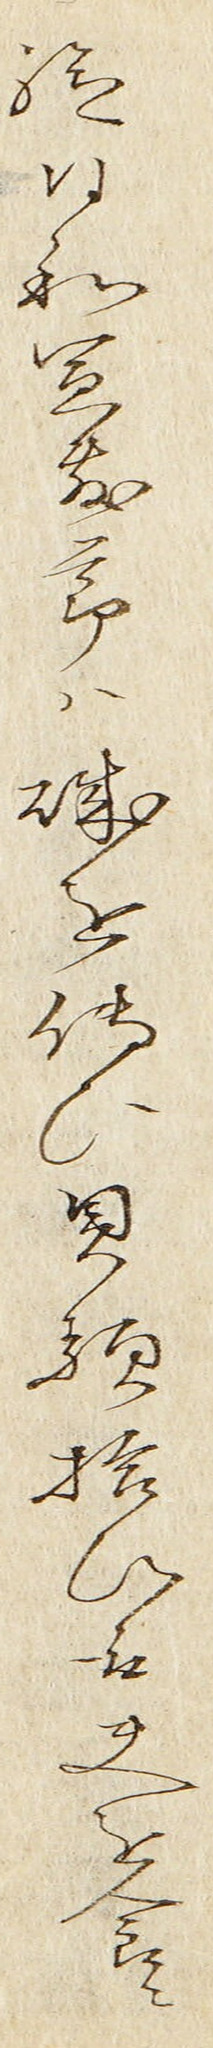給日和宜敷節は磯を伝ひ貝類拾ひ取夫を食に
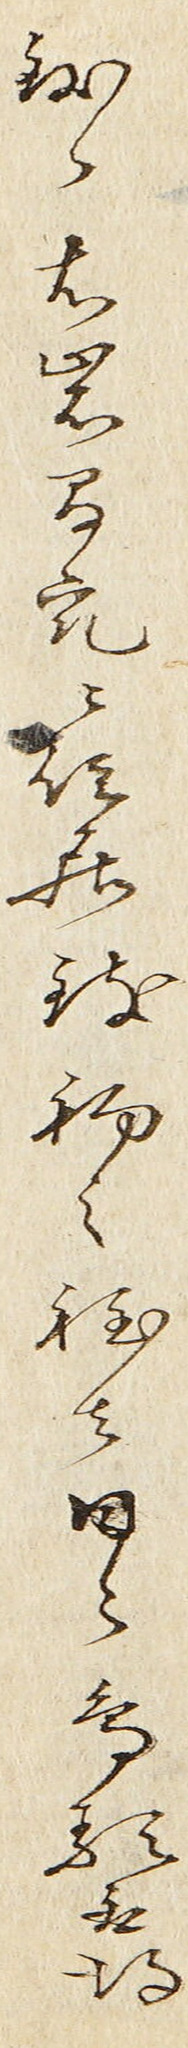致候右岩間穴に住居致初之程は日々鳥類取得
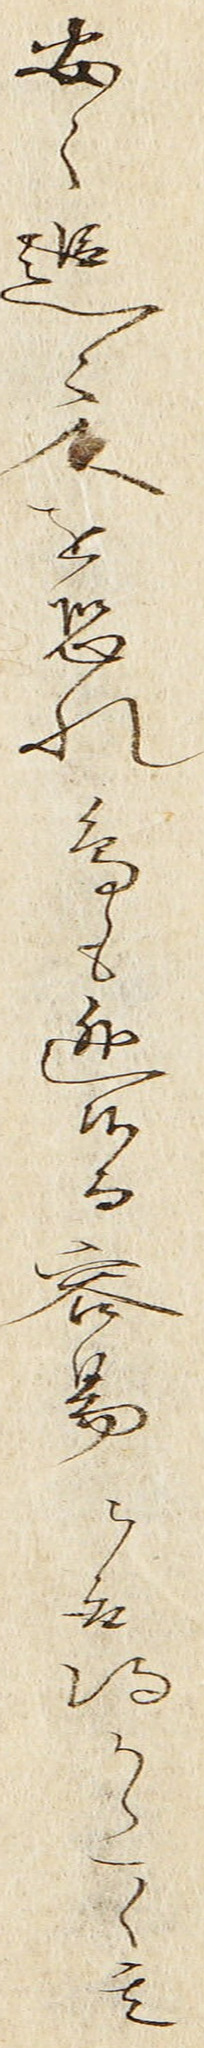安之追々人を恐れ鳥も逃候而容易に取得かたく其
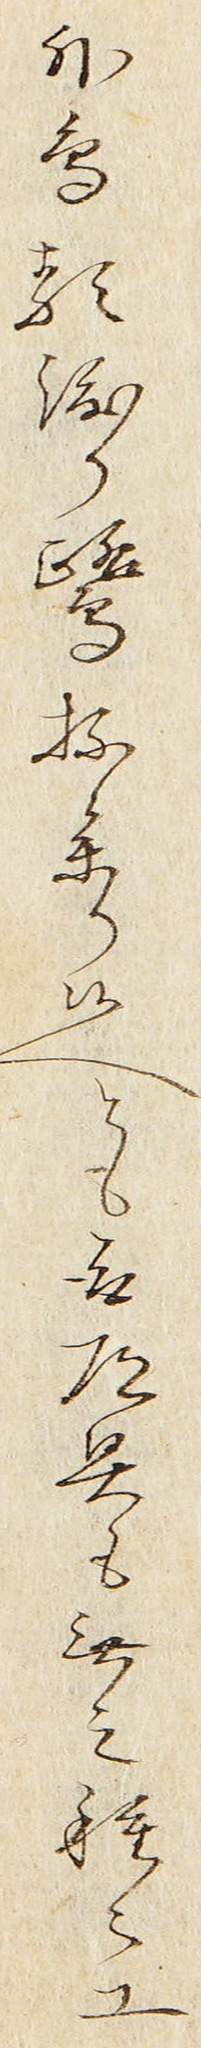外鳥類渡り鷺抔参り候へとも取道具も無之種々工
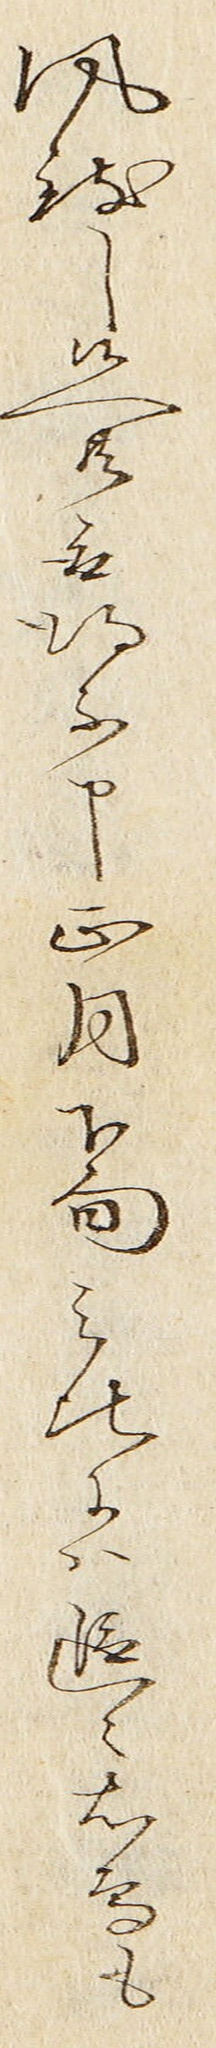風致し候へ共取得不申正月下旬之比には追々右鳥も
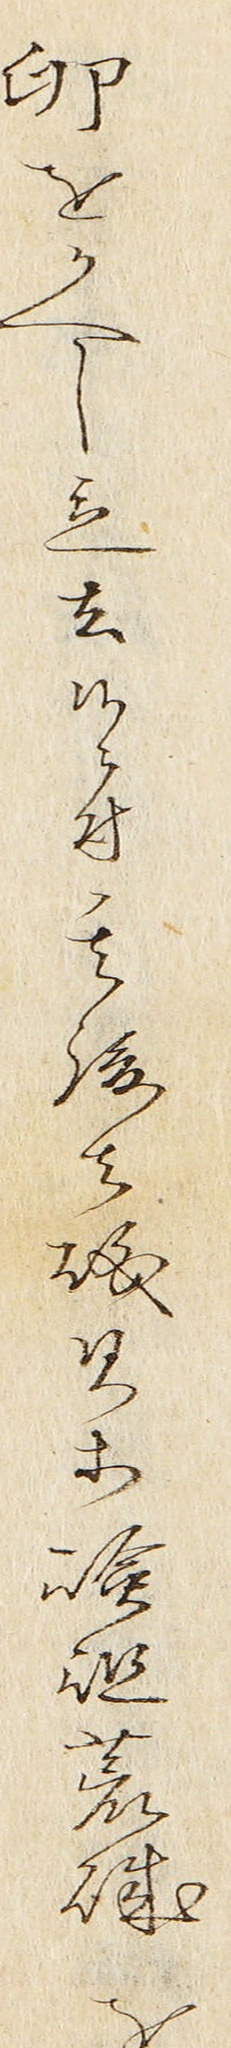卵をかへし立去候に付其後は磯貝等険阻荒磯を
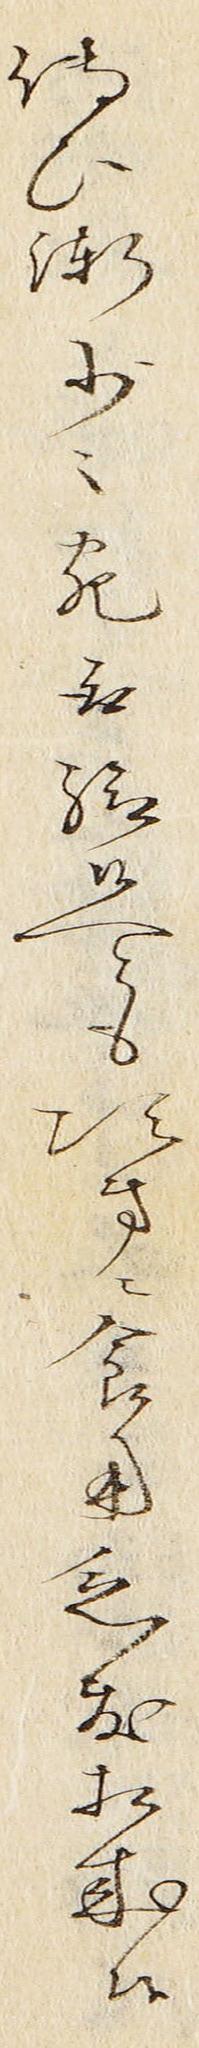伝ひ漸少々宛取給候へとも次第に食用乏敷相成候
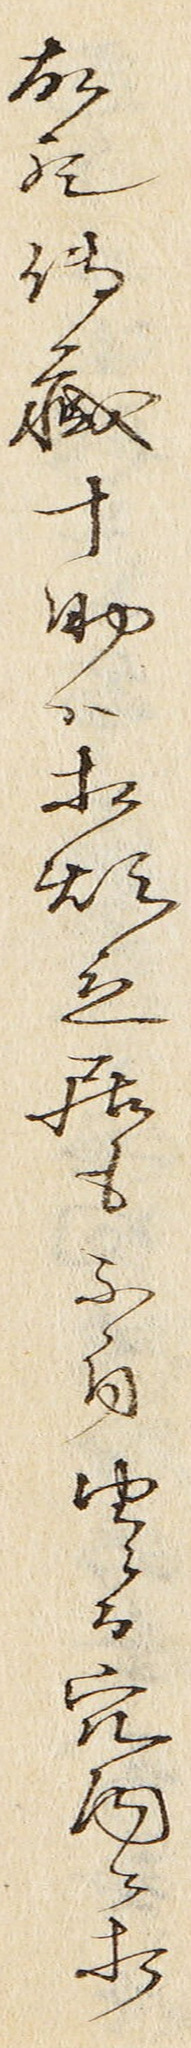故歟伝蔵十助は相煩立居も不自由に而穴内に相
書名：土佐中浜万次郎漂流記
